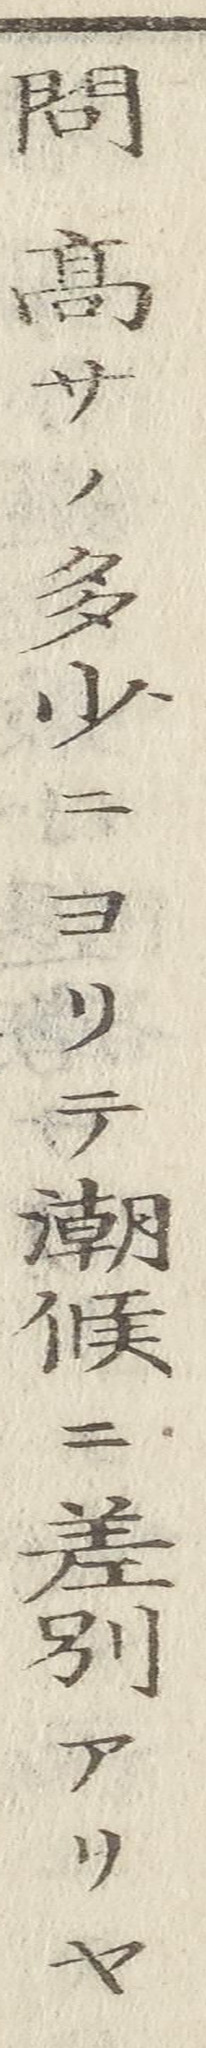問高サノ多少ニヨリテ潮候ニ差別アリヤ
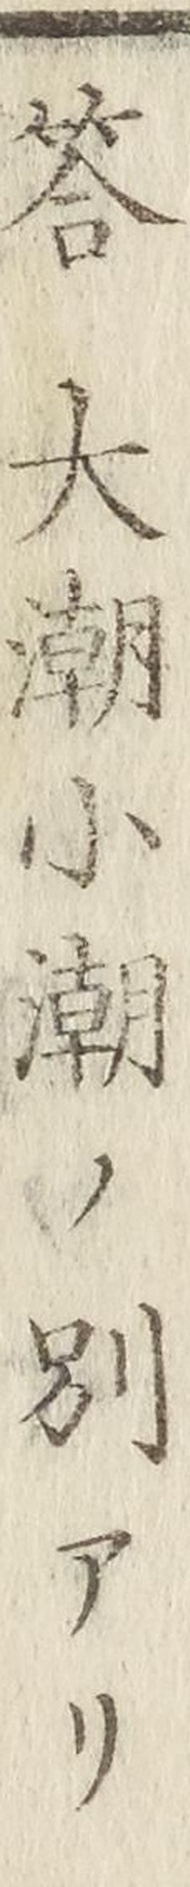答大潮小潮ノ別アリ
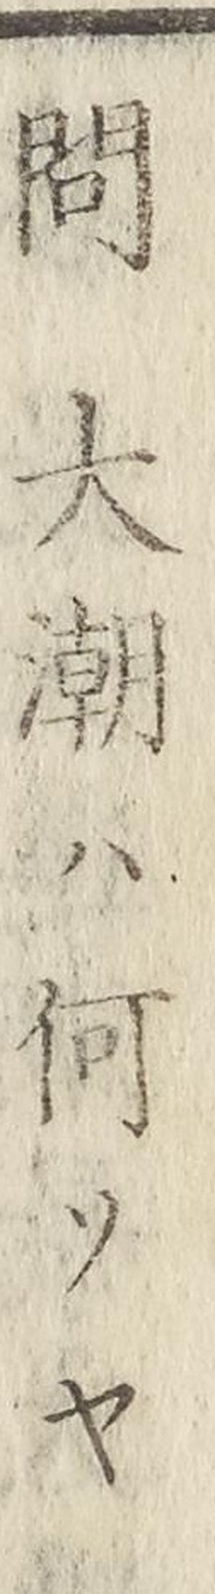問大潮ハ何ソヤ

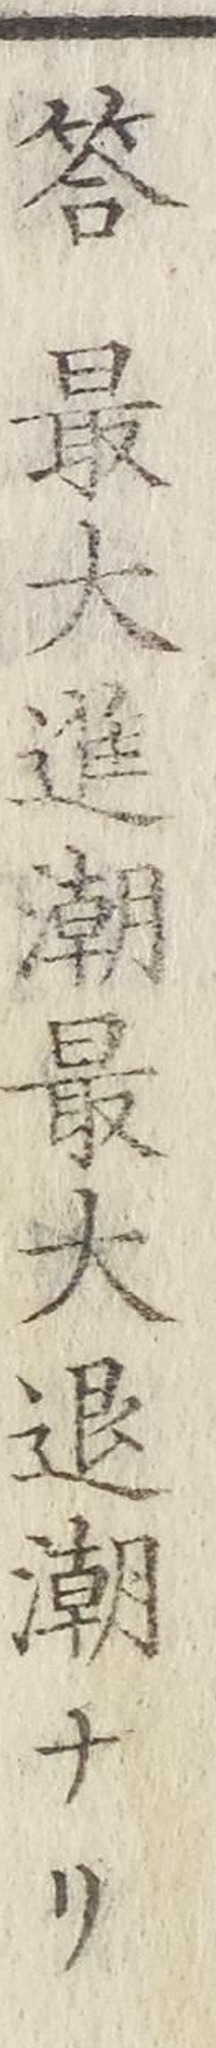答最大進潮最大退潮ナリ
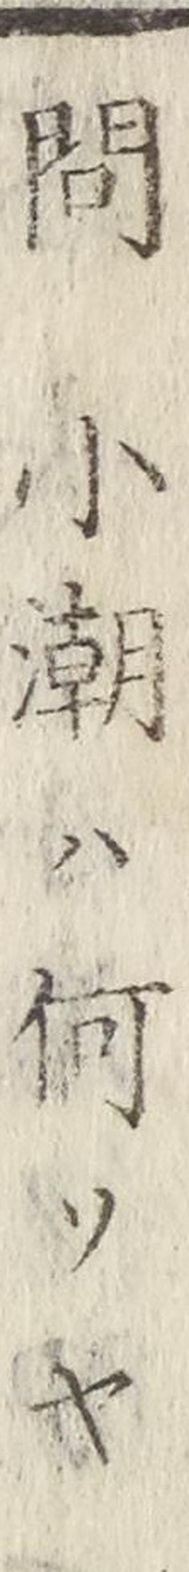問小潮ハ何ソヤ
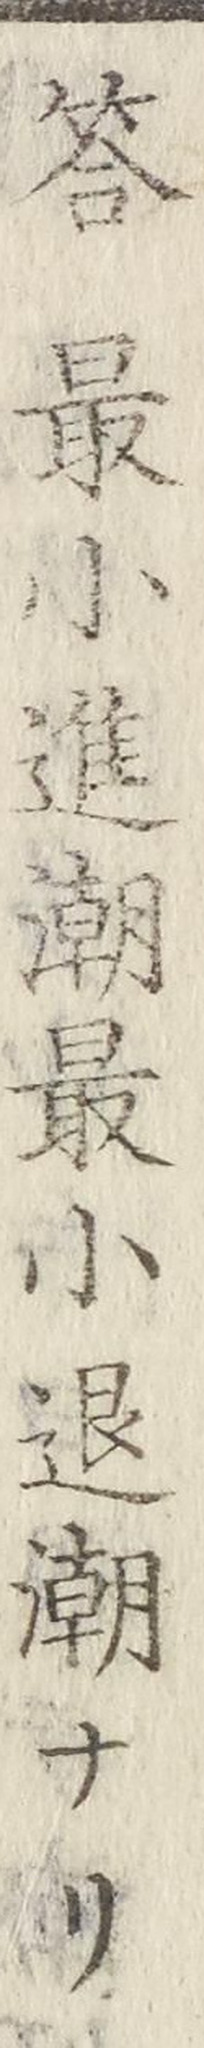答最小進潮最小退潮ナリ
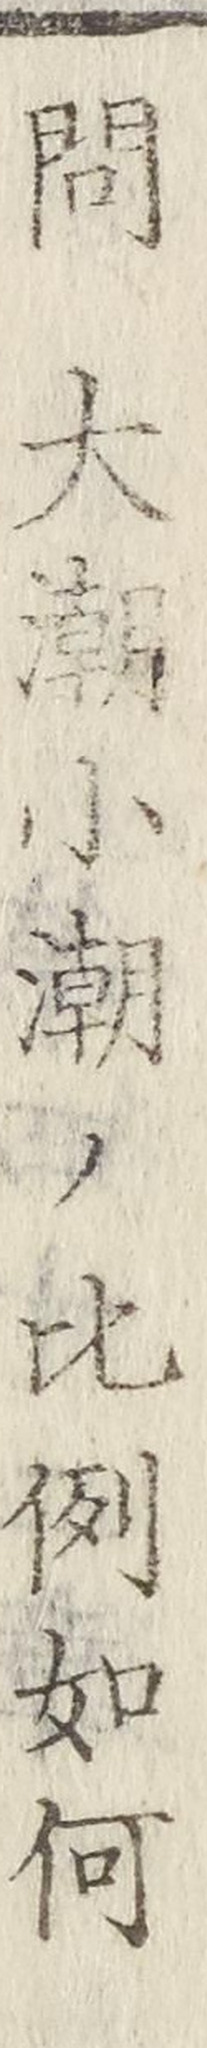問大潮小潮ノ比例如何
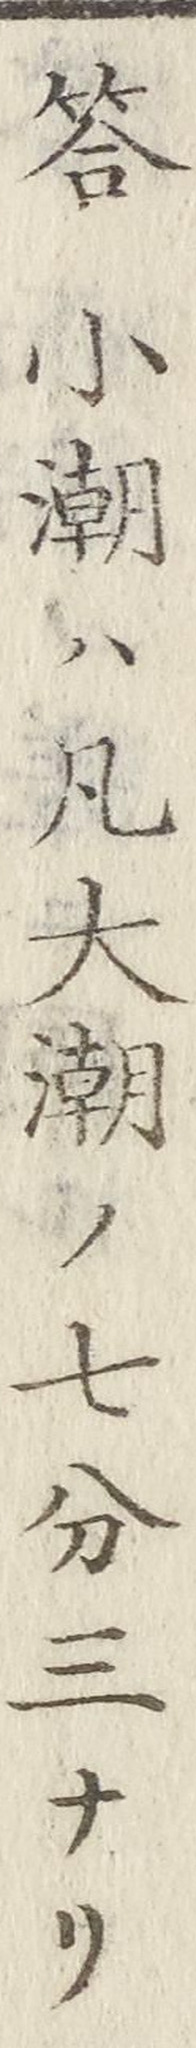答小潮ハ凡大潮ノ七分三ナリ
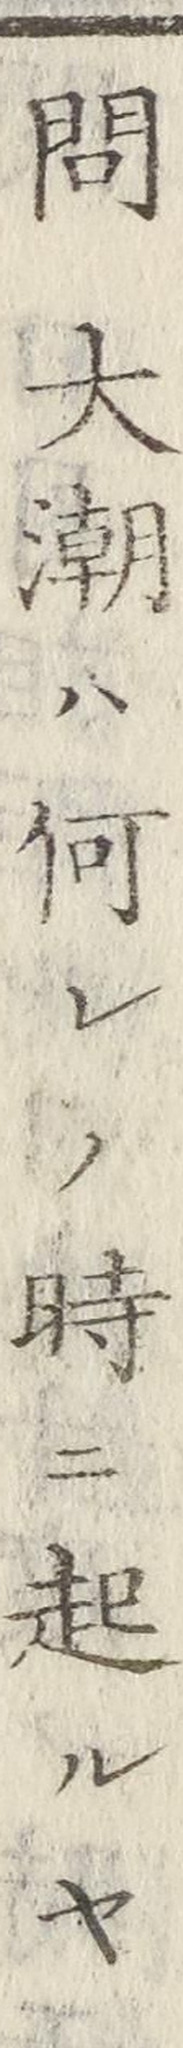問大潮ハ何レノ時ニ起ルヤ
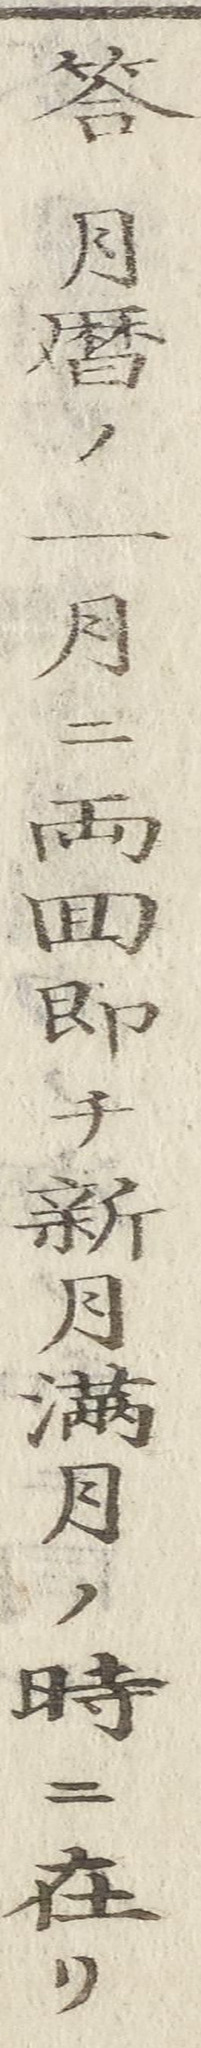答月暦ノ一月ニ両回即チ新月満月ノ時ニ在リ
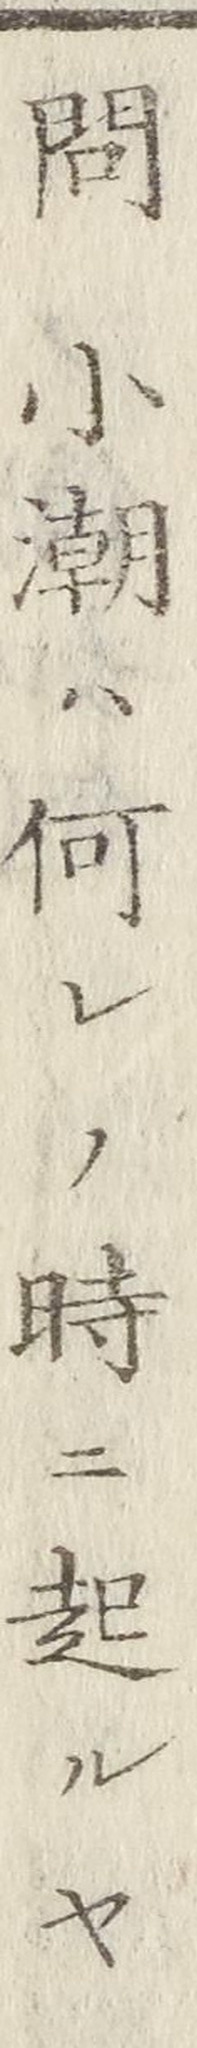問小潮ハ何レノ時ニ起ルヤ
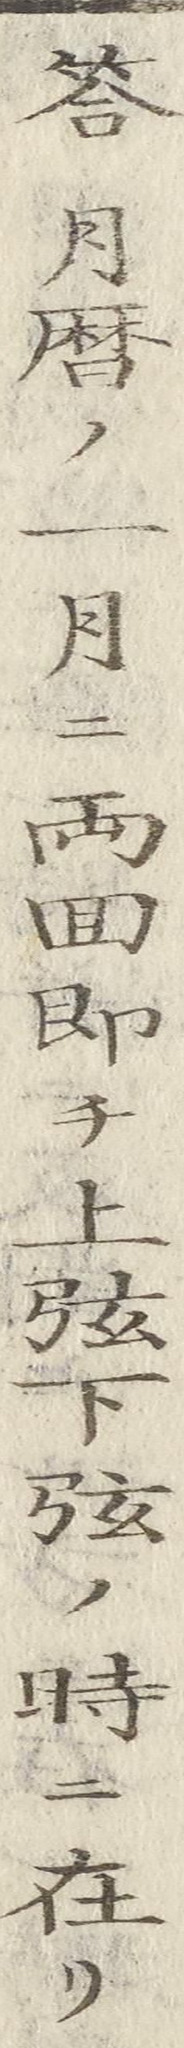答月暦ノ一月ニ両回即チ上弦下弦ノ時ニ在リ
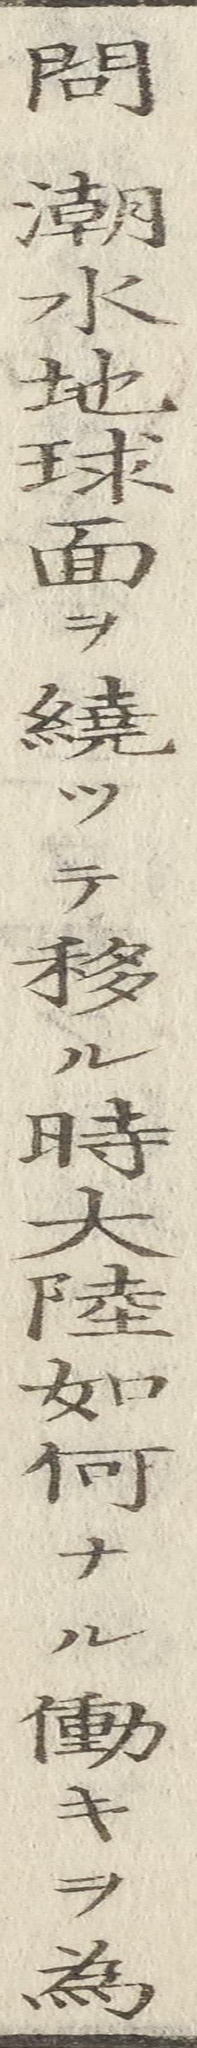問潮水地球面ヲ繞ツテ移ル時大陸如何ナル働キヲ為
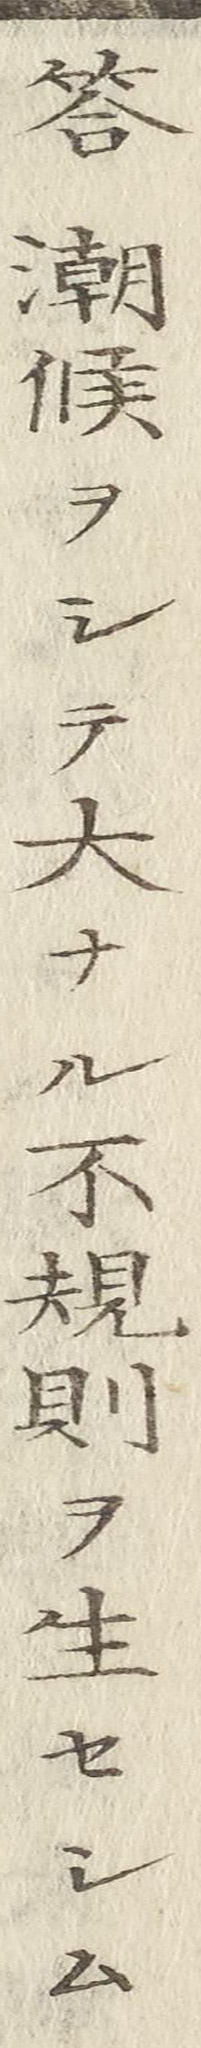答潮候ヲシテ大ナル不規則ヲ生セシム
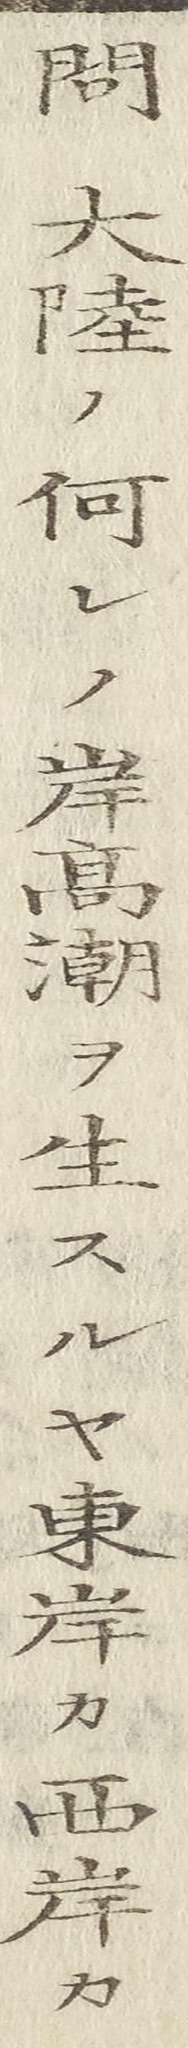問大陸ノ何レノ岸高潮ヲ生スルヤ東岸カ西岸カ
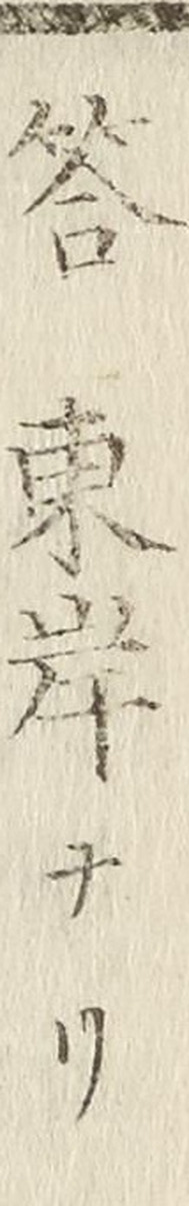答東岸ナリ
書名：星学圖説　下
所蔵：東京大学地震研究所図書室 Earthquake Research Institute Library, The University of Tokyo, JAPAN
